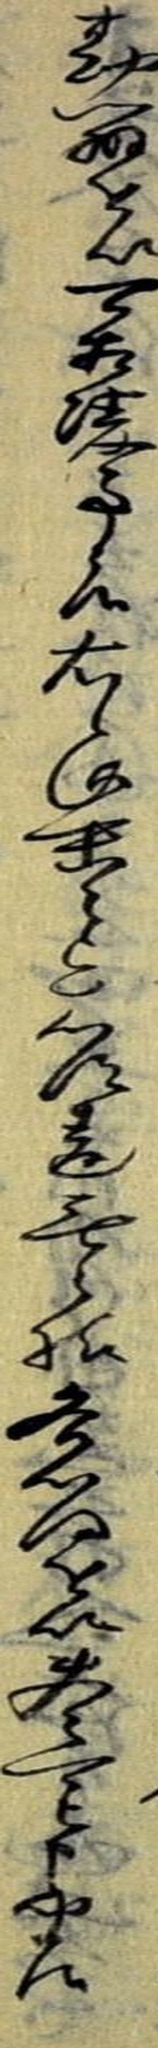勘弁を以可相凌事ニ候右之趣末々迄心得違無之様各心得を以夫々可被申聞候
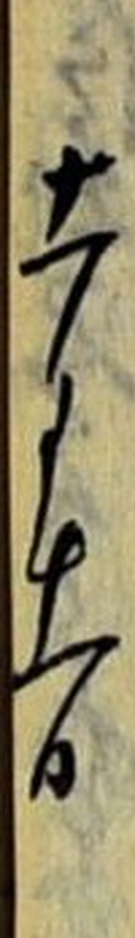十一月十一日
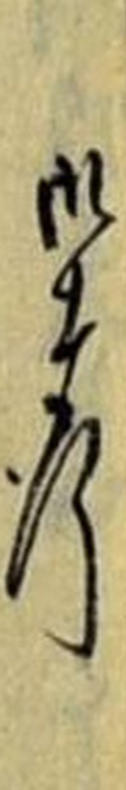御奉行
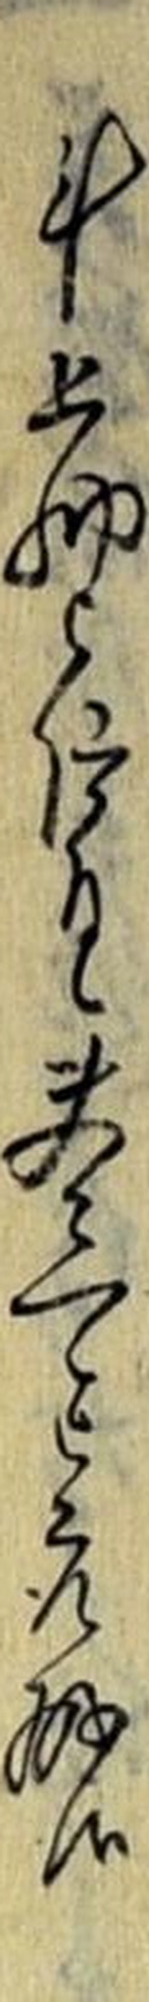斗上納被仰付候夫々被取扱候
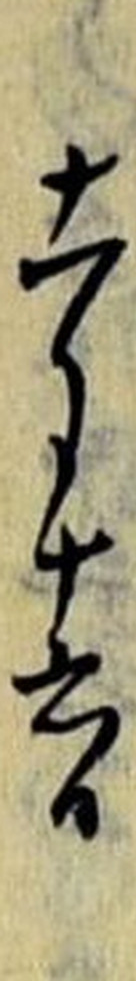十一月十六日
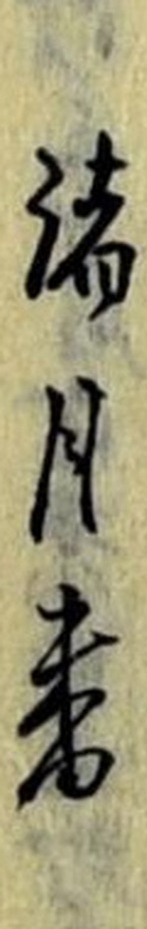諸月番
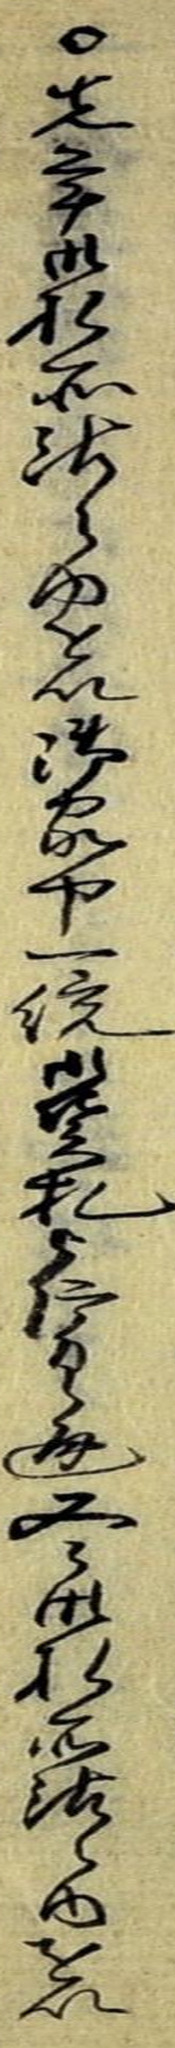〇先年御札所銀之内を以御家中一統御貸札被仰付候通又々御札所銀之内を以
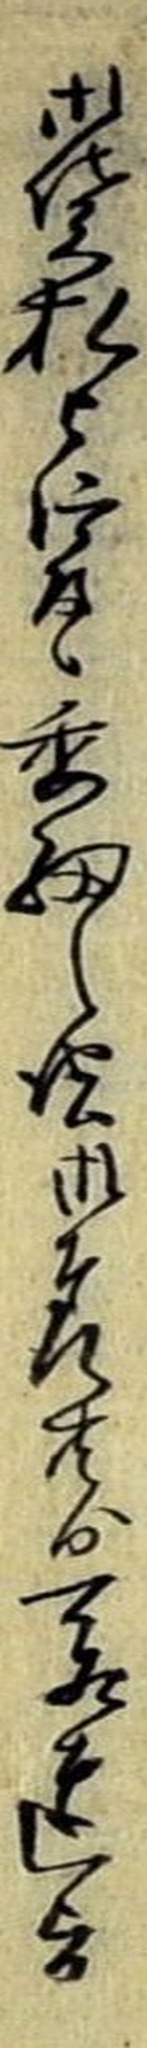御貸札被仰付候委細之儀ハ御奉行共ゟ可相達旨
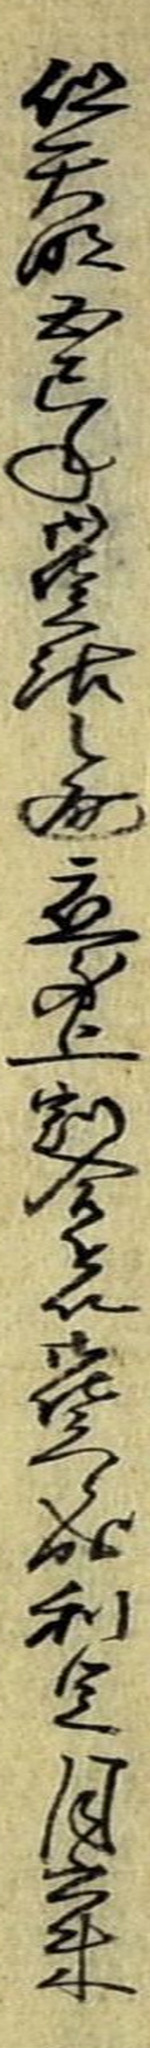但天明五巳年御貸銀之通応身上割合を以御貸被成利足月六朱
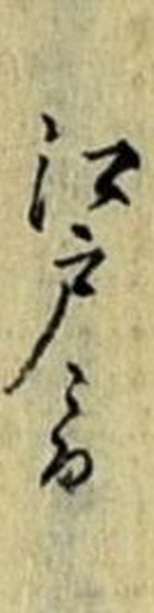江戸ニ而
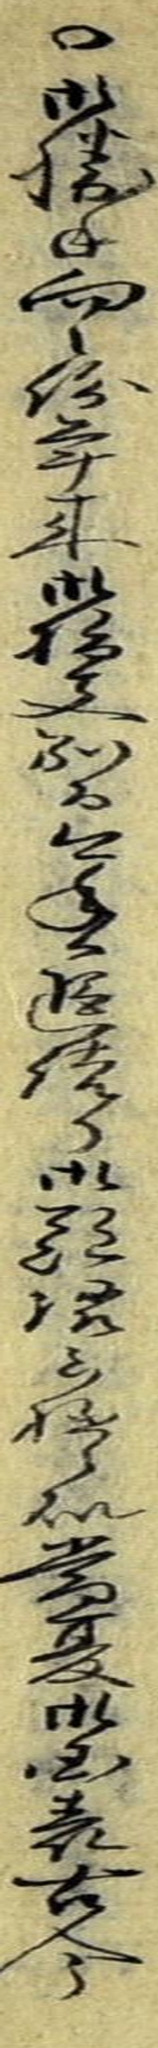〇御勝手向之儀年来御指支別而今年ハ追詰り御難渋至極之処当夏御国表古今
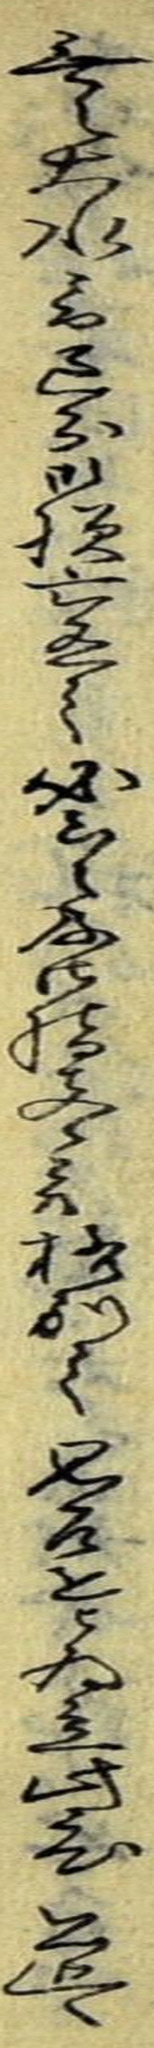無之大水ニ而過分御損亡有之必至之及御指支候ニ付格別之思召を被為立此度公辺へ

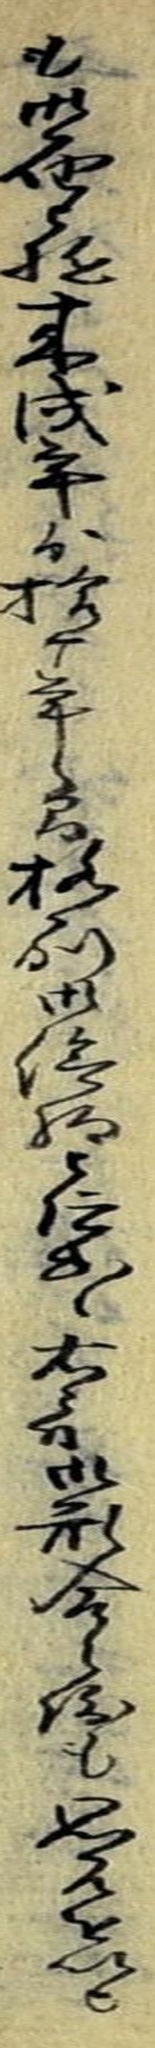も御届被遊来戌年ゟ拾ケ年之間格別御倹約被仰出候右ニ付御形合之儀も思召を以被
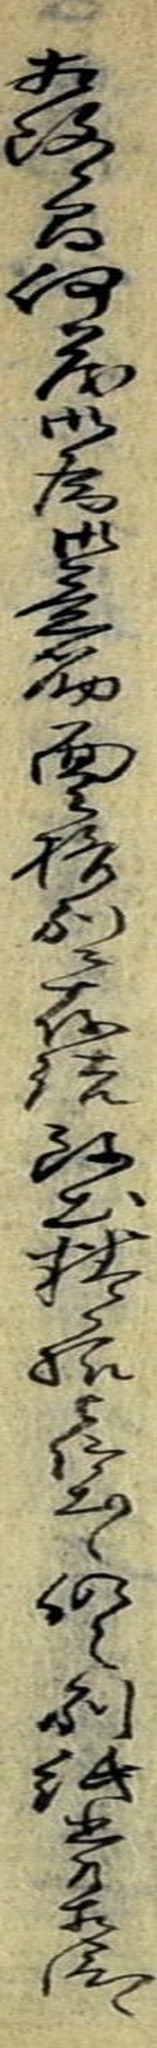相改候間何茂御為御益筋面々格別ニ存詰致出精候様被仰出候仍之別紙書付相渡候
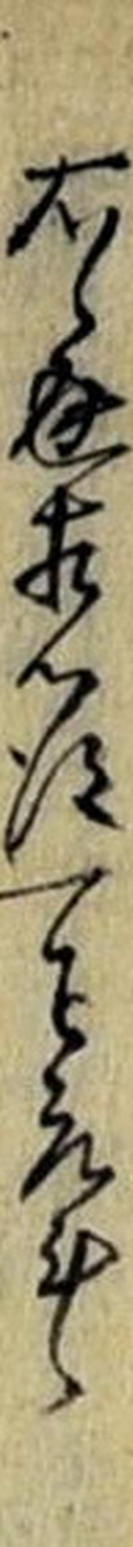右之通相心得可被取計候
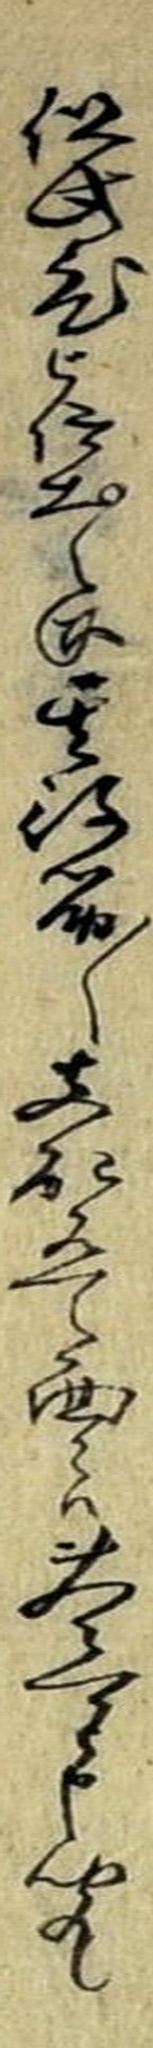但此度被仰出之趣其役筋〳〵支配有之面々へハ夫々可被申聞候
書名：命令之部 三
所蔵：福井県文書館 Fukui Prefectural Archives
